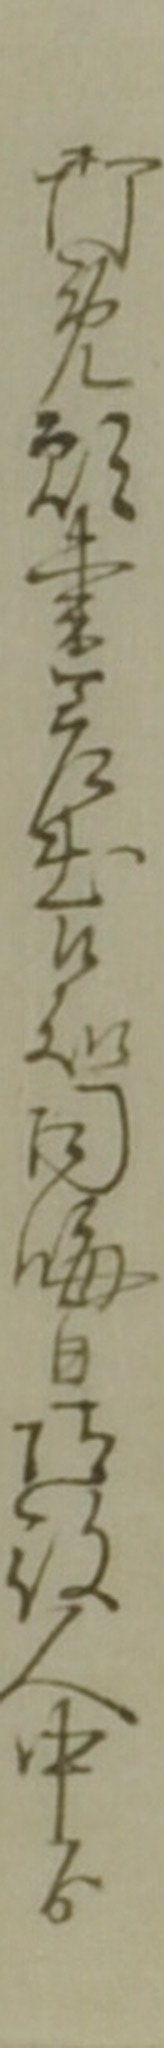御免願書差出候処同晦日御役人中ゟ
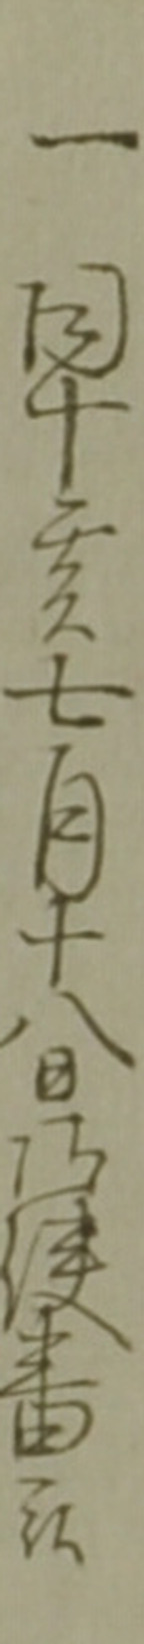一同十亥七月十八日御使番被仰付
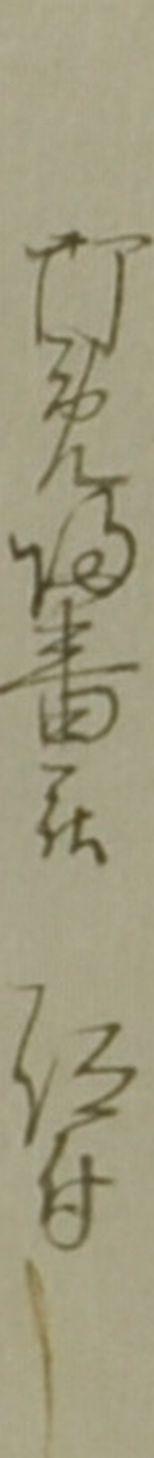御免帰番被仰付
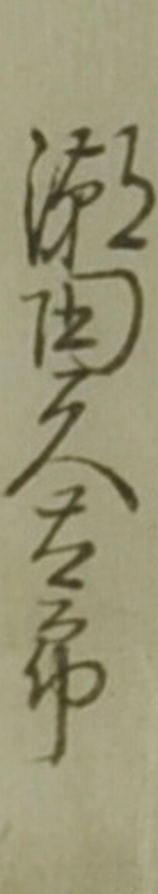潮田久太郎
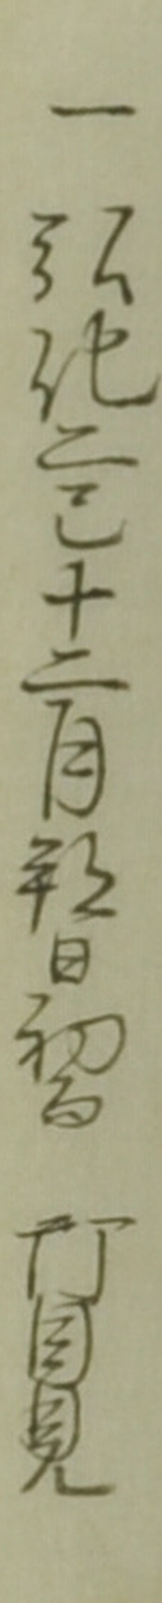一弘化二巳十二月朔日初而御目見

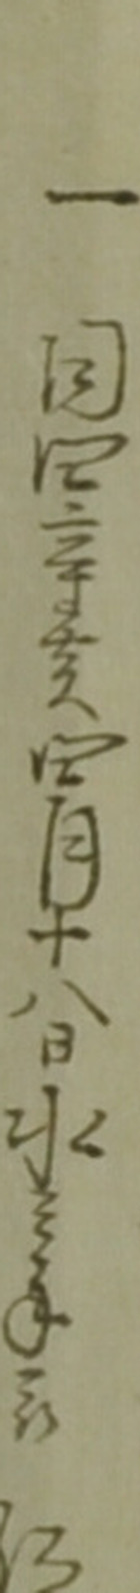一同四辛亥四月十八日水之手被仰付
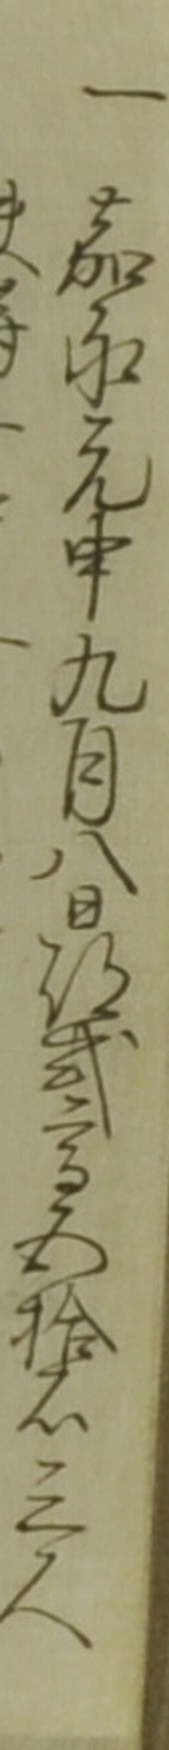一嘉永元申九月八日跡式高五拾石三人

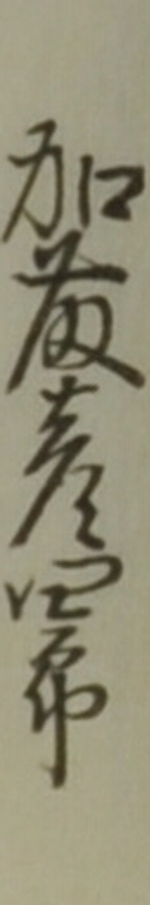加藤彦四郎
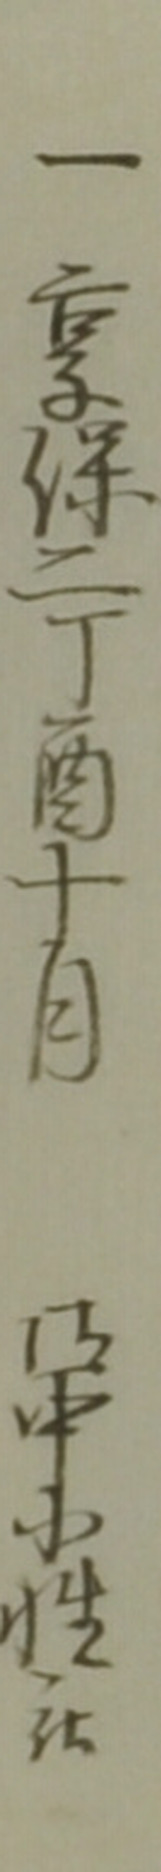一享保二丁酉十月御中小性被
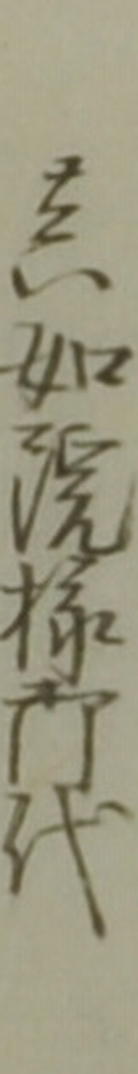真如院様御代
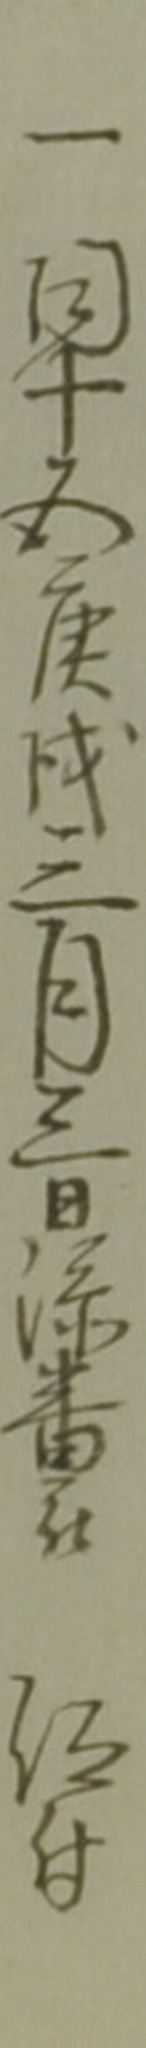一同十五庚戌三月三日添番被仰付
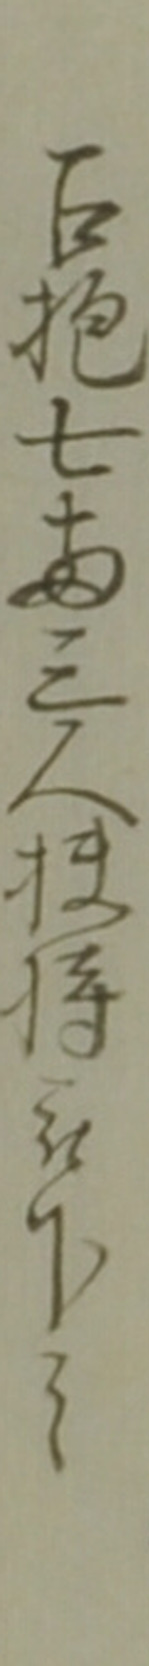召抱七両三人扶持被下之
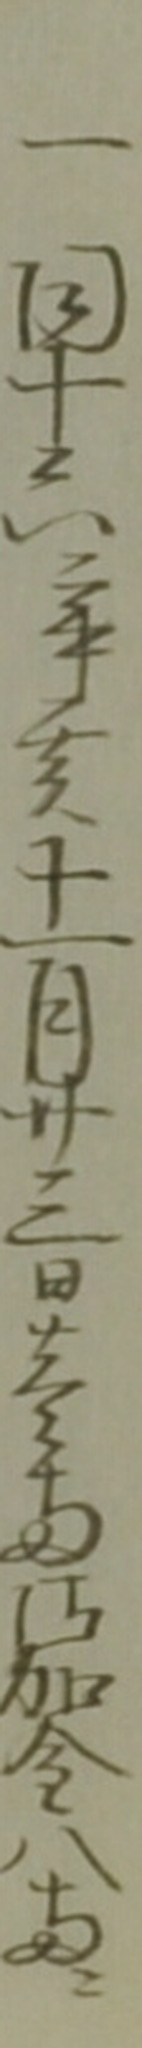一同十六辛亥十一月廿三日壱両御加金八両ニ
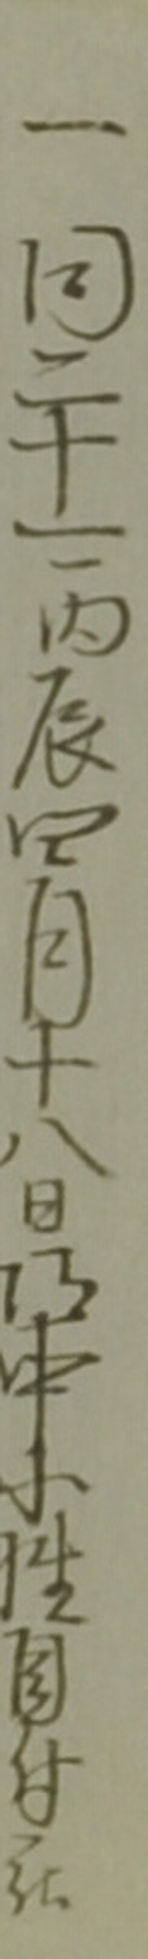一同二十一丙辰四月十八日御中小性目付被
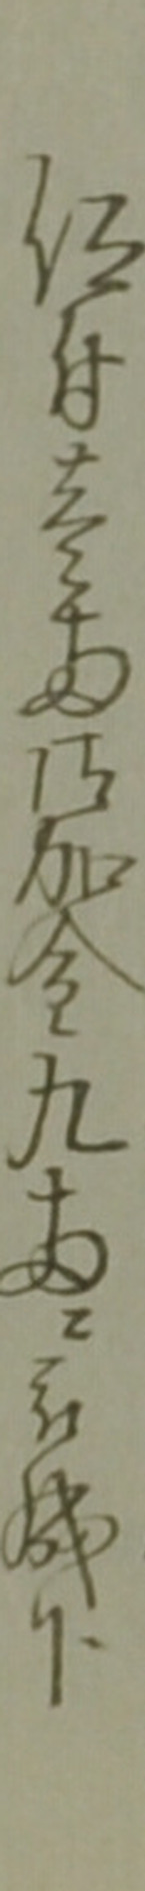仰付壱両御加金九両ニ被成下
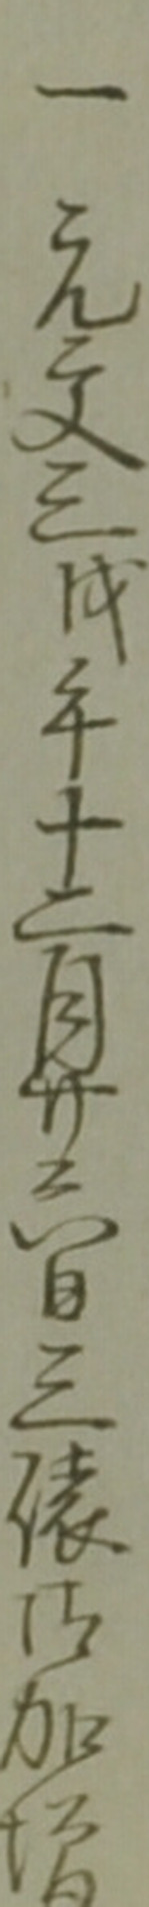一元文三戊午十二月廿六日三俵御加増
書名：給人諸士勤仕録（三）
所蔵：伊那市立高遠町図書館・合同会社AMANE
